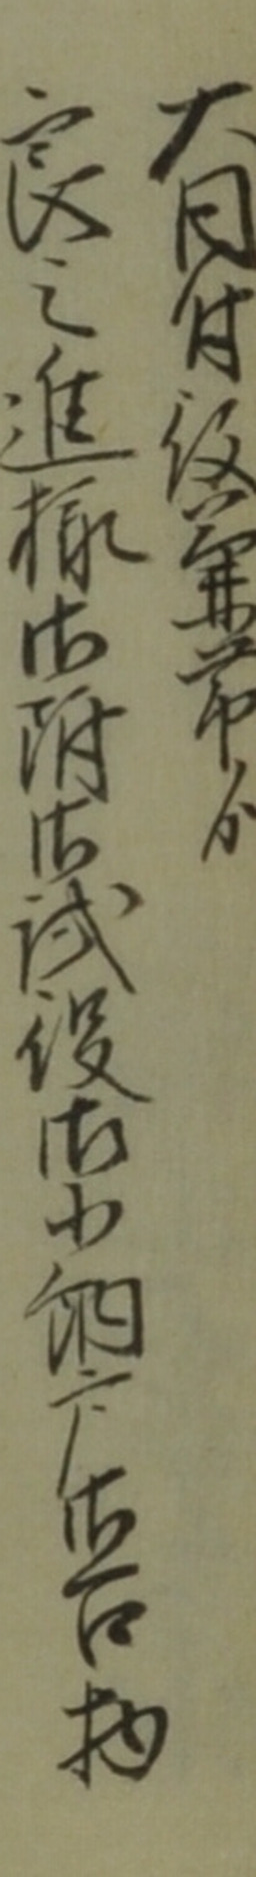良之進様御附御試御小納戸御召物
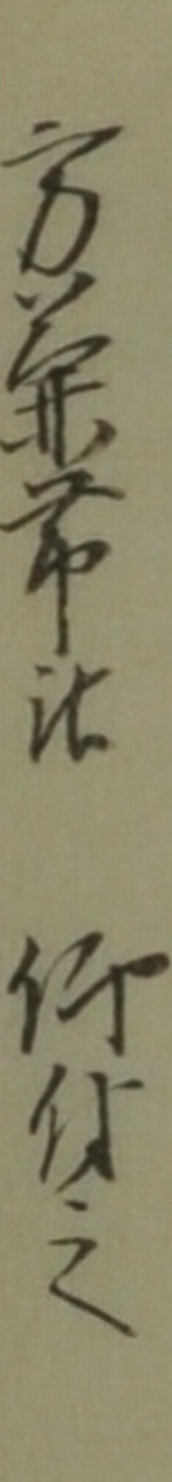方兼帯被仰付之
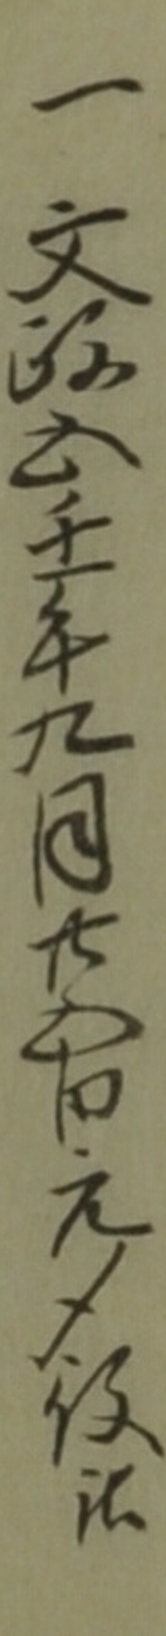一文政五壬九月廿五日元〆役被
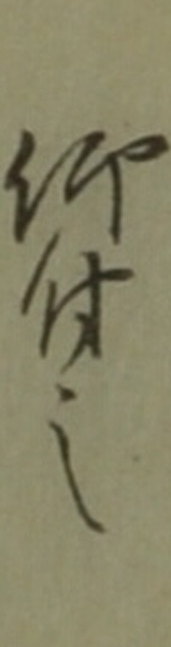仰付之
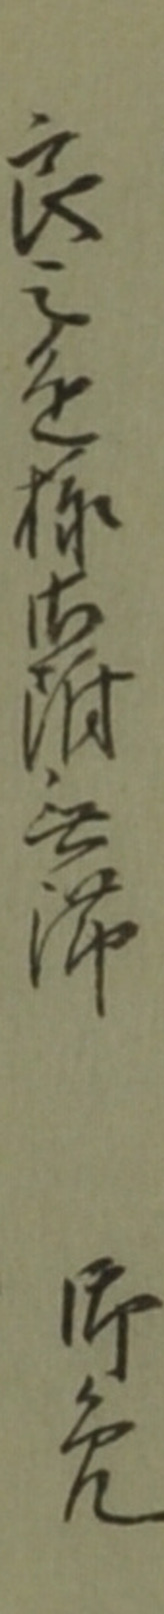良之進様御附無滞御免
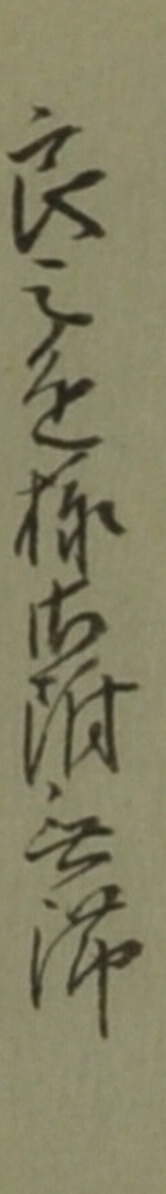良之進様御附無滞御免
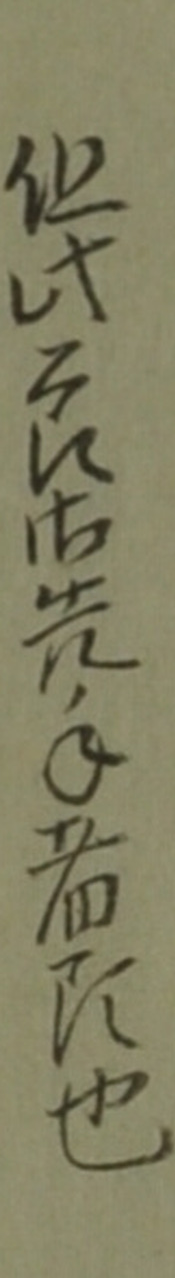但此節御先手者頭也
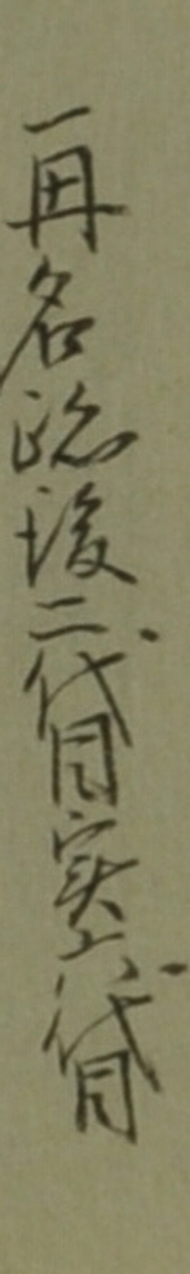再名跡後二代目実六代目
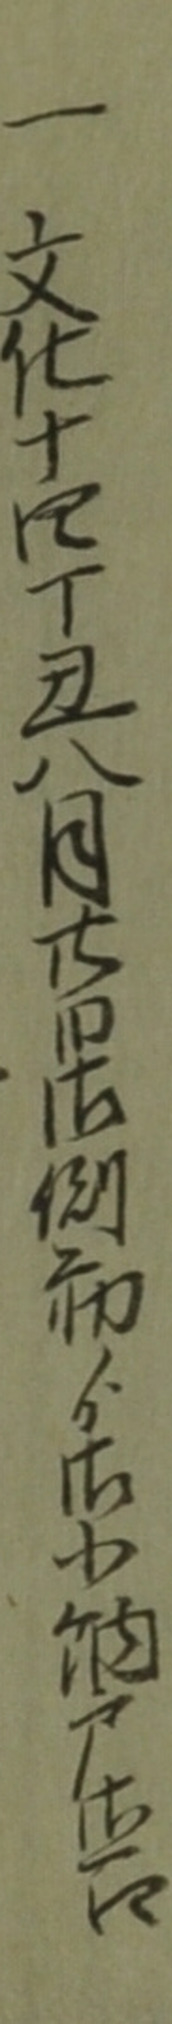一文化十四丁丑八月廿日御側勤ゟ御小納戸御召
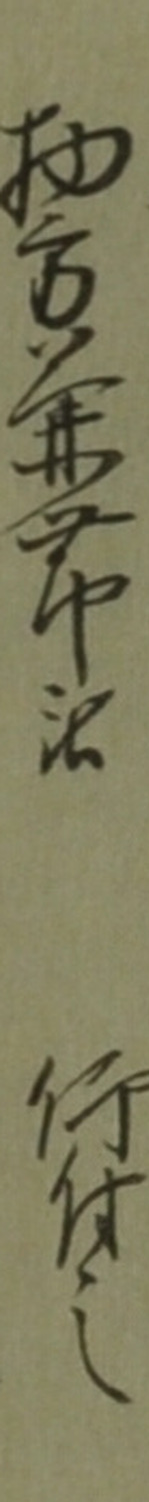物方兼帯被仰付之
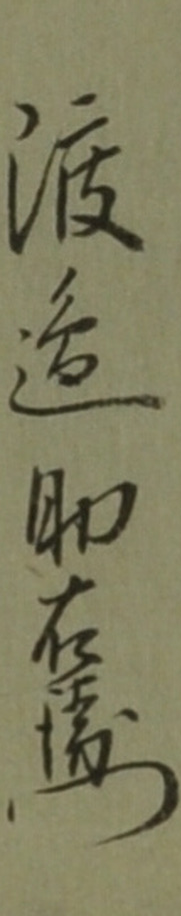渡辺助右衛門
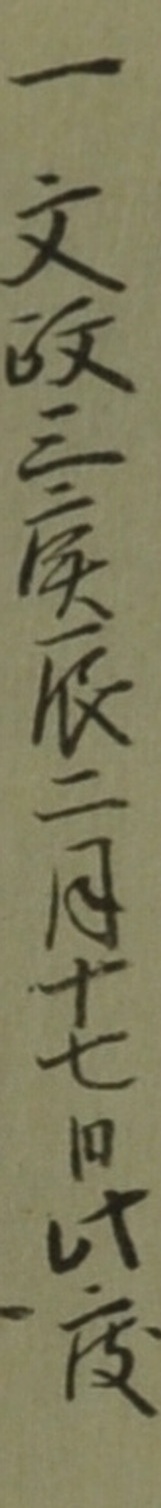一文政三庚辰二月十七日此度
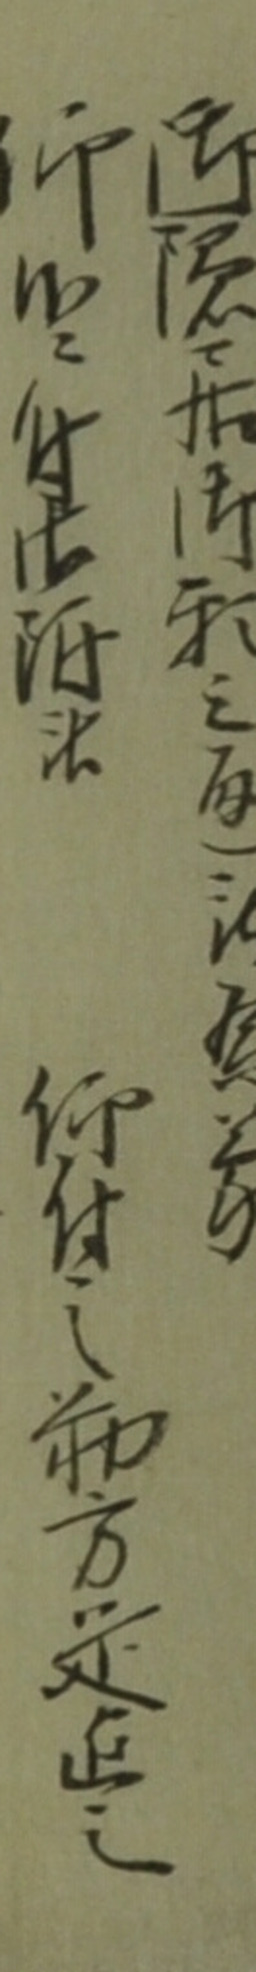御候ニ付御附被仰付之勤方是迄之
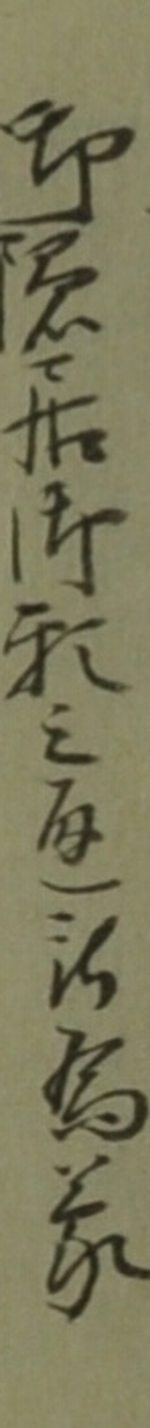御隠居御願之通被為蒙
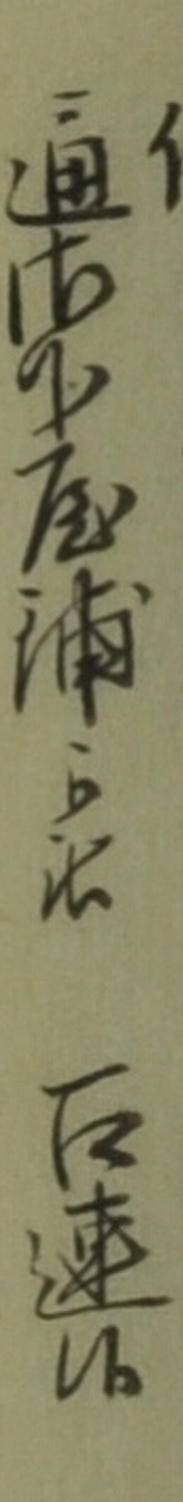通御下屋敷江被召連候

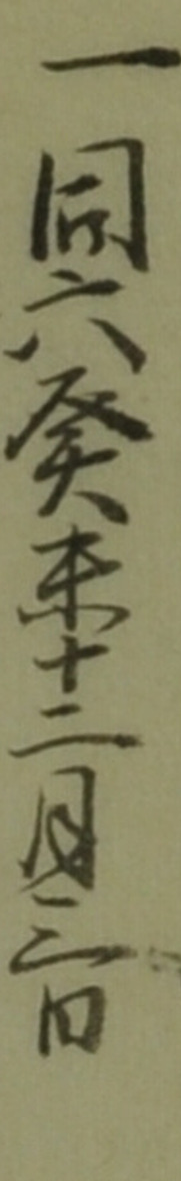一同六癸未十二月三日
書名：諸御役代々録（四）
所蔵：伊那市立高遠町図書館・合同会社AMANE
